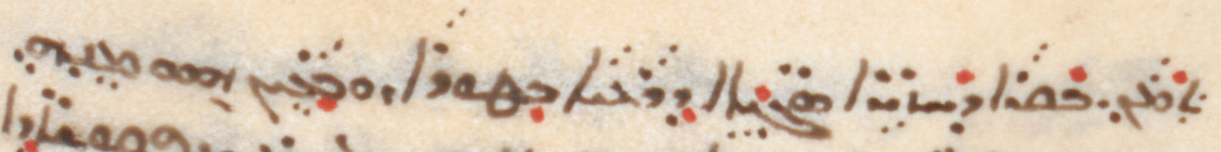ܬܡܢ܆ ܒܩܪܐ ܕܚܙܝܪ̈ܐ ܣܓ̈ܝܐܐ ܕܪܥܝܐ ܒܛܘܪܐ. ܘܒ̇ܥܝܢ ܗܘܘ ܡܢܗ܆
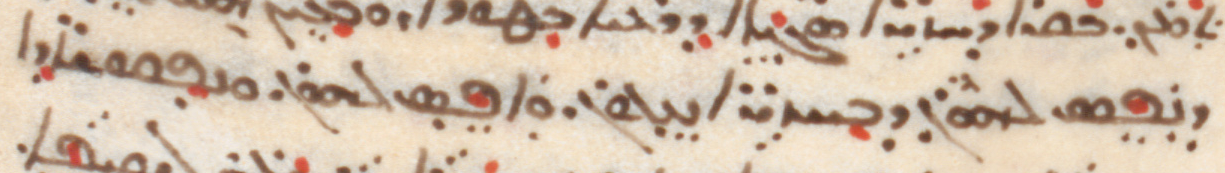ܕܢܦܣ ܠܗܘܢ ܕܒܚܙܝܪ̈ܐ ܢܥܠܘܢ. ܘܐܦܣ̣ ܠܗܘܢ. ܘܢܦ̣ܩܘ ܫ̈ܐܕܐ
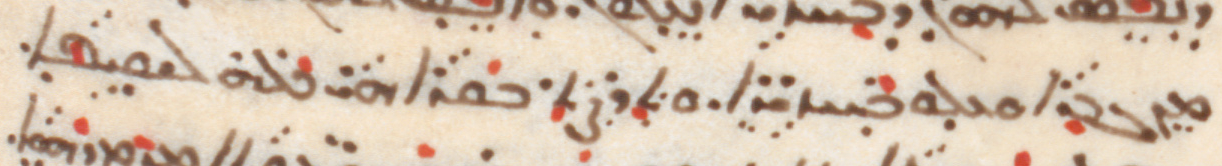ܡ̣ܢ ܓܒܪܐ ܘܥܠ̣ܘ ܒܚܙܝܪ̈ܐ. ܘܬܪܨܬ ܒܩܪܐ ܗ̇ܝ ܟܠܗ̇ ܠܫܩܝܦܐ.
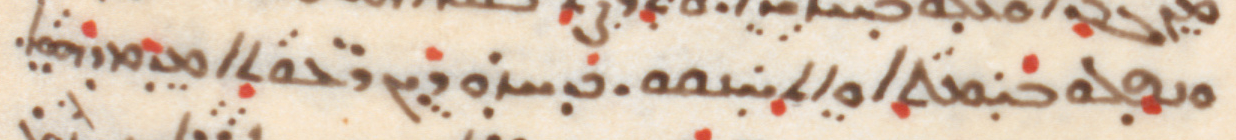ܘܢܦܠ̣ܘ ܒܝܡܬܐ ܘܐܬܚܢܩܘ. ܟܕ ܚܙ̣ܘ ܕܝܢ ܪ̈ܥܘܬܐ ܡܕܡ ܕܗܘܐ
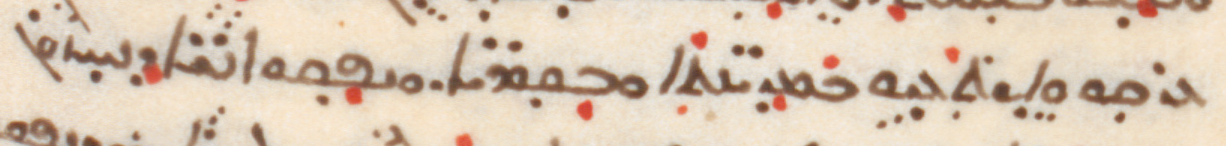ܥܪܩ̣ܘ ܘܐܫܬܥ̣ܝܘ ܒܡܕܝܢ̈ܬܐ ܘܒܩܘܪ̈ܝܐ. ܘܢܦܩ̣ܘ ܐܢܫ̈ܐ ܕܢܚܙܘܢ
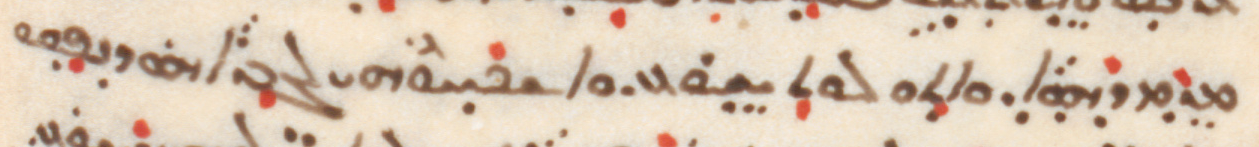ܡܕܡ ܕܗܘܐ. ܘܐܬ̣ܘ ܠܘܬ ܝܫܘܥ. ܘܐܫܟܚ̣ܘܗܝ ܠܓܒܪܐ ܗ̇ܘ ܕܢܦ̣ܩܘ
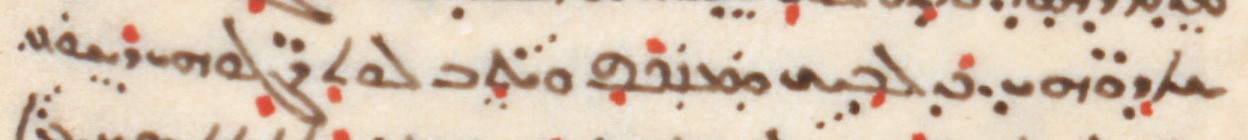ܫܐܕܘ̈ܗܝ܆ ܟܕ ܠܒܝܫ ܘܡܢܟܦ ܘܝ̇ܬܒ ܠܘܬ ܪ̈ܓܠܘܗܝ ܕܝܫܘܥ.
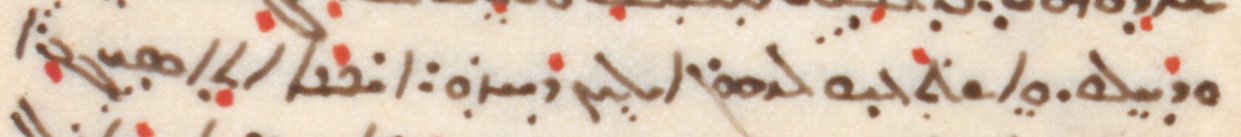ܘܕܚ̣ܠܘ. ܘܐܫܬܥܝ̣ܘ ܠܗܘܢ ܐܝܠܝܢ ܕܚܙ̣ܘ܇ ܐܝܟܢܐ ܐܬ̣ܐܣܝ ܓܒܪܐ
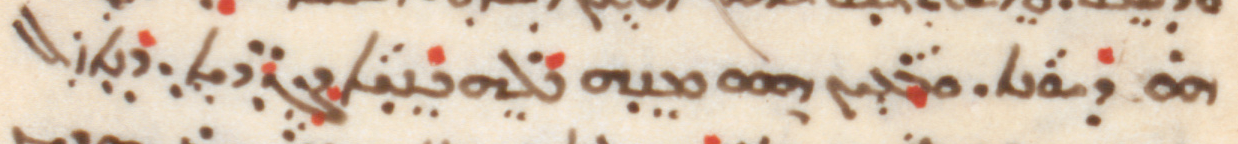ܗ̇ܘ ܕܝܘܢܐ. ܘܒܥ̣ܝܢ ܗܘܘ ܡܢܗ ܟܠܗ ܟܢܫܐ ܕܓܕܪ̈ܝܐ܆ ܕܢܐܙܠ
